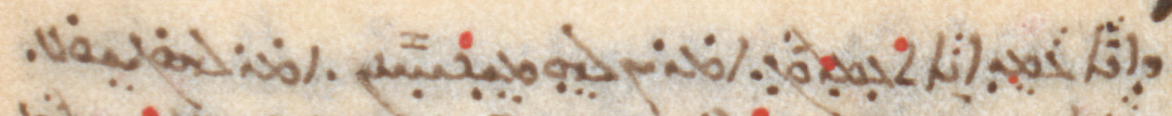ܕܐܢܐ ܥܡܕ ܐܢܐ ܬܥܡܕܘܢ܆ ܐܡ̇ܪܝܢ ܠܗ ܡܫܟܚܝܢܢ. ܐܡ̇ܪ ܠܗܘܢ ܝܫܘܥ.
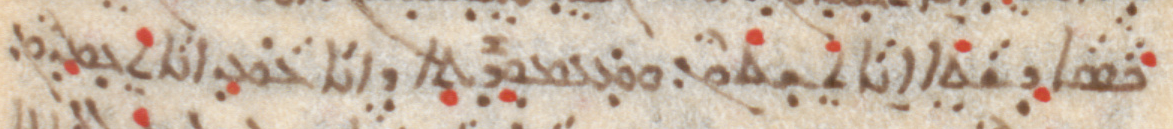ܟܣܐ ܕܫܬܐ ܐܢܐ ܬܫܬܘܢ. ܘܡܥܡܘܕܝܬܐ ܕܐܢܐ ܥ̇ܡܕ ܐܢܐ ܬܥܡܕܘܢ
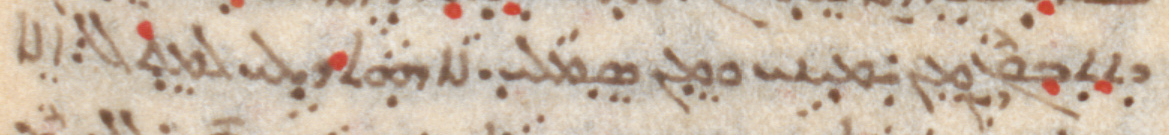ܕܬܬܒܘܢ ܕܝܢ ܡܢ ܝܡܝܢܝ ܘܡ̣ܢ ܣܡܠܝ܆ ܠܐ ܗܘܬ ܕܝܠܝ ܠܡܬܠ: ܐܠܐ
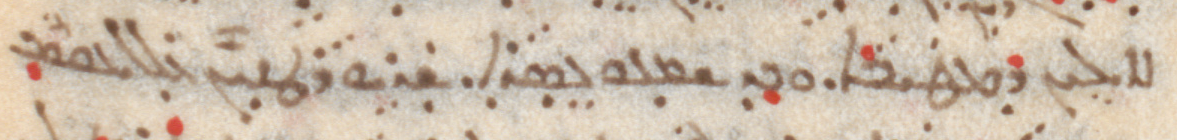ܠܐܠܝܢ ܕܡܛܝܒܐ. ܘܟܕ ܫܡ̣ܥܘ ܥܣܪܐ. ܫܪܝܘ ܪܛܢܝܢ ܥܠ ܥܩܘܒ
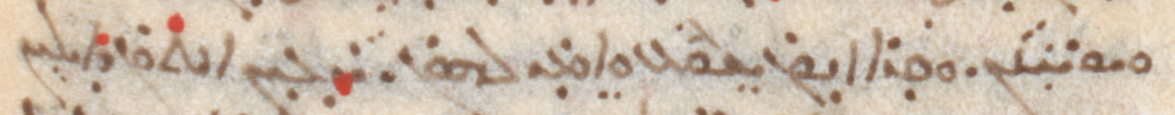ܘܝܘܚܢܢ. ܘܩ̣ܪܐ ܐܢܘܢ ܝܫܘܥ ܘܐܡܪ ܠܗܘܢ. ܝ̇ܕܥܝܢ ܐܢܬܘܢ ܕܐܝܠܝܢ
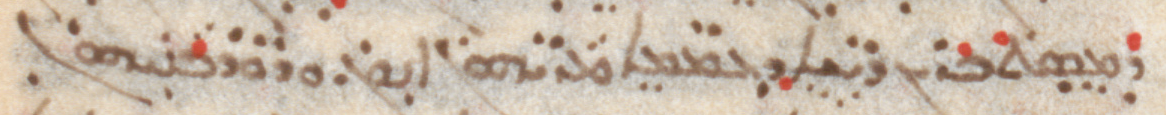ܪܡܣܬܒܪܝܢ ܪ̈ܝܫܐ ܕܥܡ̈ܡܐ ܡܪ̈ܝܗܘܢ ܐܢܘܢ. ܘܪ̈ܘܪܒܢܝܗܘܢ
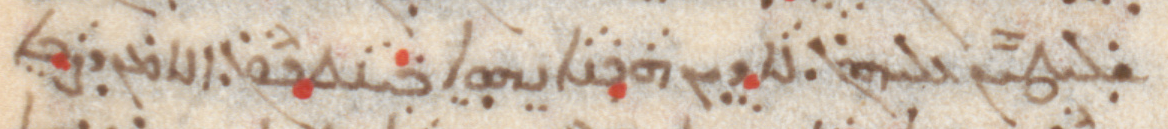ܫܠܝܛܝܢ ܥܠܝܗܘܢ. ܠܐ ܕܝܢ ܗܟܢܐ ܢܗܘܐ ܒܝܢܬܟܘܢ. ܐܠܐ ܡ̇ܢ ܕܨܒܐ
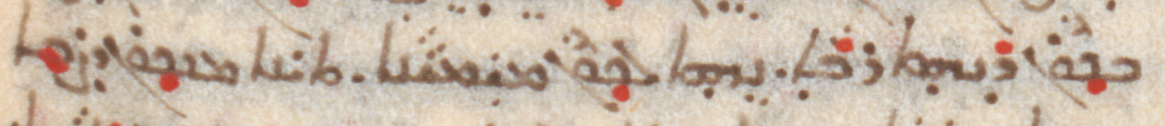ܒܟܘܢ ܕܢܗܘܐ ܪܒܐ܆ ܢܗܘܐ ܠܟܘܢ ܡܫܡܫܢܐ. ܘܐܝܢܐ ܡܢܟܘܢ ܕܨ̇ܒܐ
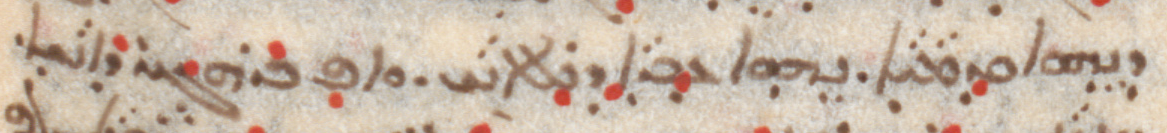ܕܢܗܘܐ ܩܕܡܝܐ. ܢܗܘܐ ܥܒܕܐ ܕܟܠ ܐܢܫ. ܘܐܦ ܒܪܗ ܓܝܪ ܕܐܢܫܐ
